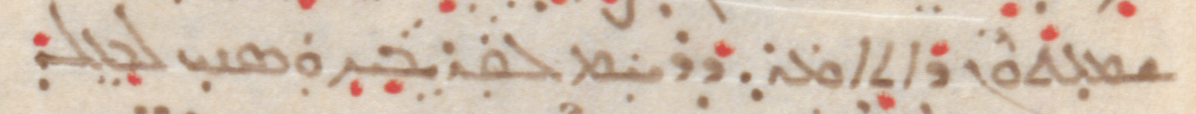ܫܡܥܬܘܢ ܕܐܬܐܡܪ܆ ܕܪܚܡ ܠܩܪܝܒܟ ܘܣܢܝ ܠܒܥܠܕ
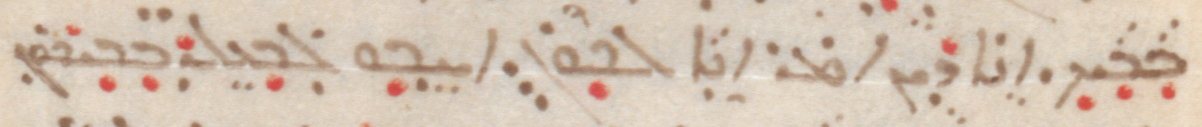ܒܒܟ. ܐܢܐ ܕܝܢ ܐܡ̇ܪ ܐܢܐ ܠܟܘܢ܆ ܐܚܒܘ ܠܒܥܠܕܒ̈ܒܝܟܘܢ.
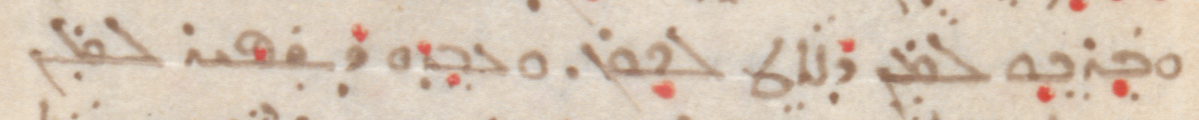ܘܒܪܟܘ ܠܡ̇ܢ ܕܠܐܛ ܠܟܘܢ. ܘܥܒܕܘ ܕܫܦܝܪ ܠܡܢ
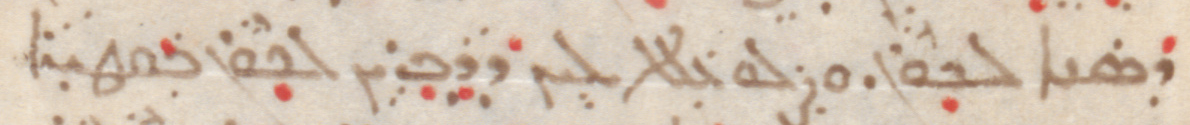ܕܣܢܐ ܠܟܘܢ. ܘܨܠܘ ܥܠ ܐܝܠܝܢ ܕܕܒܪܝܢ ܠܟܘܢ ܒܩܛܝܪܐ
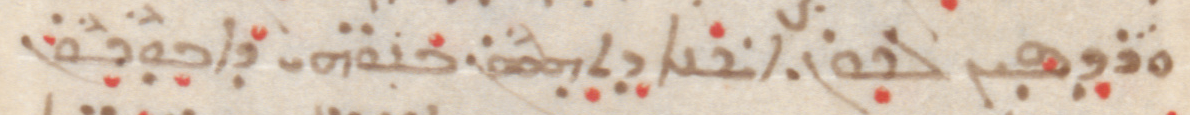ܘܪܕܦܝܢ ܠܟܘܢ. ܐܝܟܢܐ ܕܬܗܘܘܢ ܒܢܘ̈ܗܝ ܕܐܒܘܟܘܢ
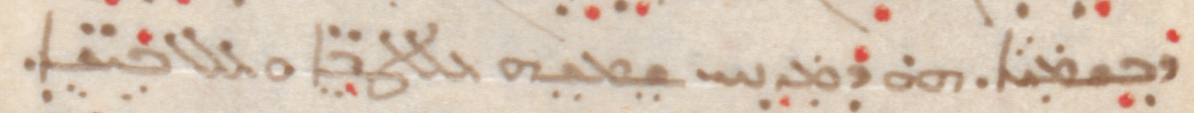ܕܒܫܡܝܐ. ܗ̇ܘ ܕܡܕܢܚ ܫܡܫܗ ܥܠ ܛܒ̈ܐ ܘܥܠ ܒܝ̈ܫܐ
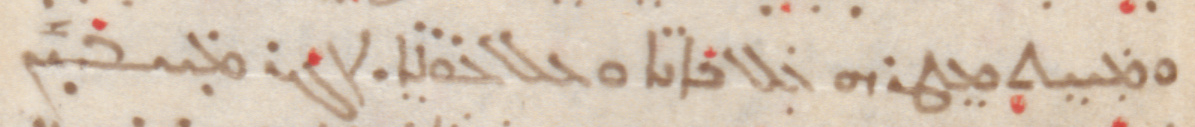ܘܡܚܬ ܡܛܪܗ ܥܠ ܟܐܢ̈ܐ ܘܥܠ ܥܘ̈ܠܐ ܐܢ ܓܝܪ ܡܚܒܝܢ
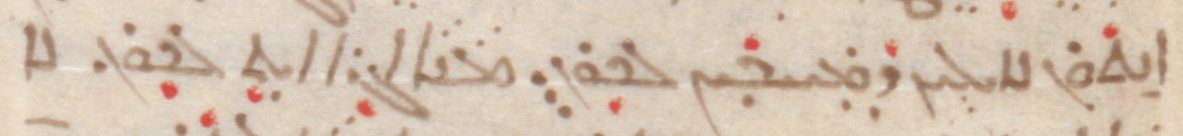ܐܢܬܘܢ ܠܐܝܠܝܢ ܕܡܚܒܝܢ ܠܟܘܢ܆ ܡܢܐ ܐܓܪܐ ܐܝܬ ܠܟܘܢ. ܠܐ
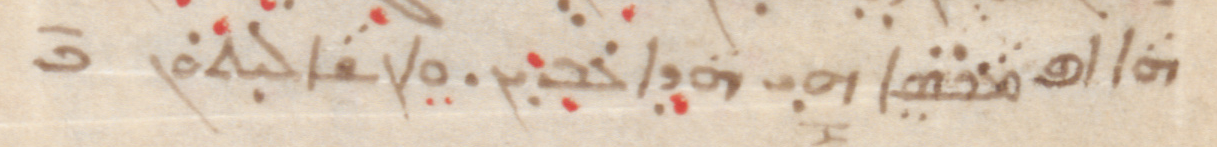ܗܐ ܐܦ ܡܟ̈ܣܐ ܗ̣ܝ ܗܕܐ ܥܒܕܝܢ. ܘܐܢ ܫܐܠܝܢ ܐܢܬܘܢ ܏ܒ
